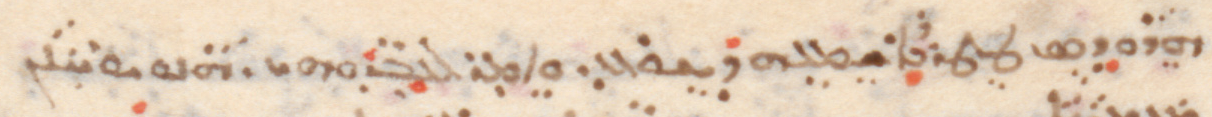ܗܪܘܕܣ ܛܛܪܪܟܐ ܫܡܥܗ ܕܝܫܘܥ܆ ܘܐܡ̣ܪ ܠܥܒ̈ܕܘܗܝ. ܗܢܘ ܝܘܚܢܢ
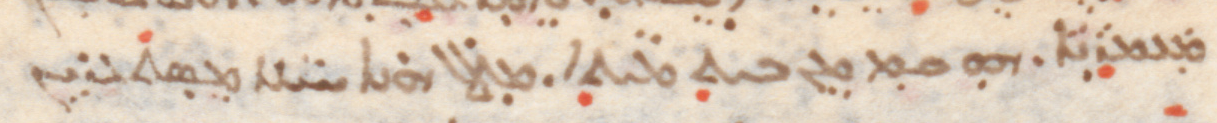ܡܥܡܕܢܐ. ܗ̣ܘ ܩ̣ܡ ܡܢ ܒܝܬ ܡ̈ܝܬܐ. ܡܛܠ ܗ̇ܢܐ ܚܝ̈ܠܐ ܡܣܬܥܪܝܢ
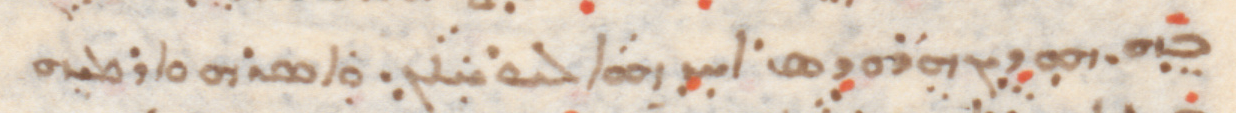ܒܗ. ܗ̣ܘ ܕܝܢ ܗܪܘܕܣ ܐܚܕ ܗܘܐ ܠܝܘܚܢܢ܆ ܘܐܣܪܗ ܘܐܪܡܝܗ
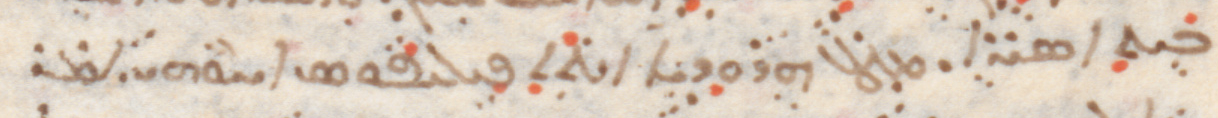ܒܝܬ ܐܣܝܪ̈ܐ. ܡܛܠ ܗܪܘܕܝܐ ܐܢܬܬ ܦܝܠܝܦܘܣ ܐܚܘܗܝ. ܐܡ̇ܪ
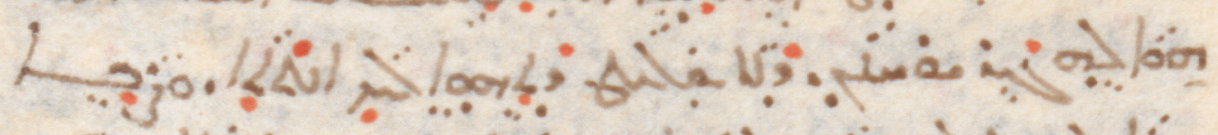ܗܘܐ ܠܗ ܓܝܪ ܝܘܚܢܢ܆ ܕܠܐ ܫܠܝܛ ܕܬܗܘ̣ܐ ܠܟ ܐܢܬܬܐ. ܘܨ̇ܒܐ
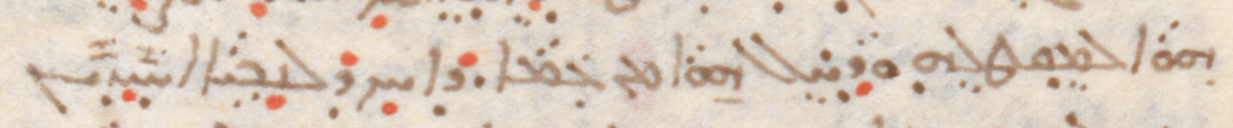ܗܘܐ ܠܡܩܛܠܗ ܘܕܚ̇ܠ ܗܘܐ ܡܢ ܥܡܐ. ܕܐܝܟ ܕܠܢܒܝܐ ܐܚܝܕܝܢ
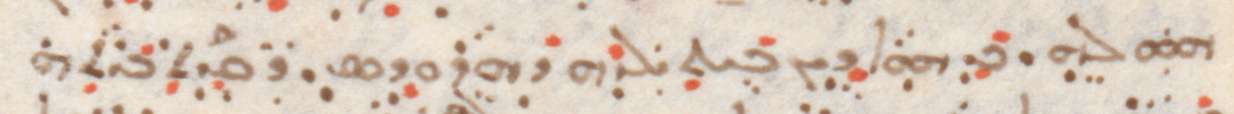ܗܘܘ ܠܗ. ܟܕ ܗܘܐ ܕܝܢ ܒܝܬ ܝܠܕܗ ܕܗܪܘܕܣ: ܪܩܕܬ݀ ܒܪܬܗ̇
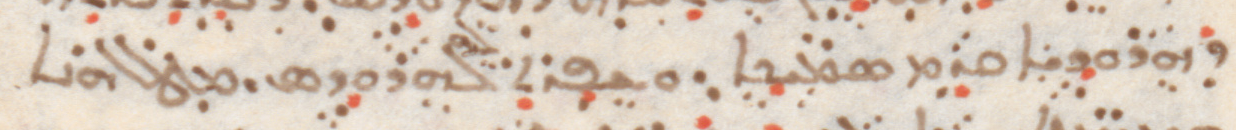ܕܗܪܘܕܝܐ ܩܕܡ ܣܡ̈ܝܟܐ: ܘܫܦܪܬ݀ ܠܗܪܘܕܣ. ܡܛܠ ܗܢܐ
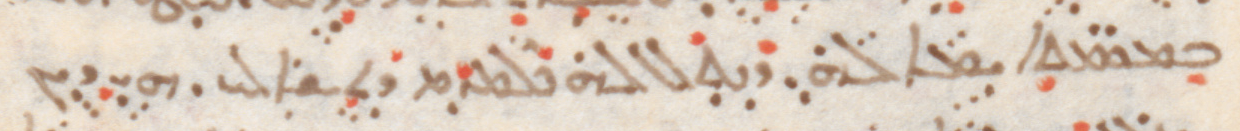ܒܡܘܡ̈ܬܐ ܝܡܐ ܠܗ܆ ܕܢܬܠ ܠܗ̇ ܟܠܡܕܡ ܕܬܫܐܠܝ. ܗ̣ܝ ܕܝܢ
